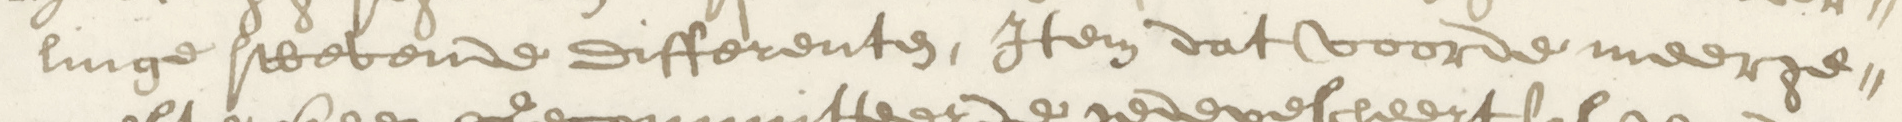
linge swevende differenten. Item dat voorde meerge„
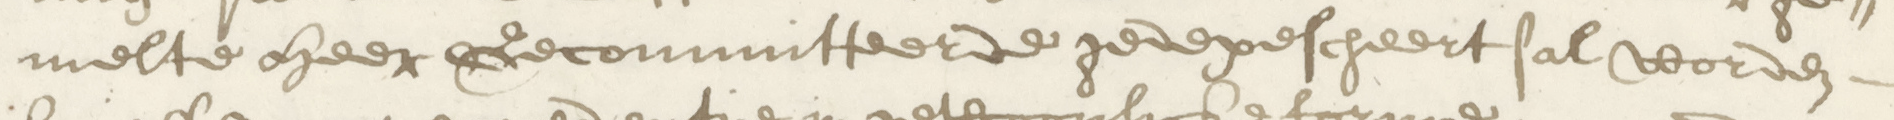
melte heer Gecommitteerde gedepescheert sal worden —
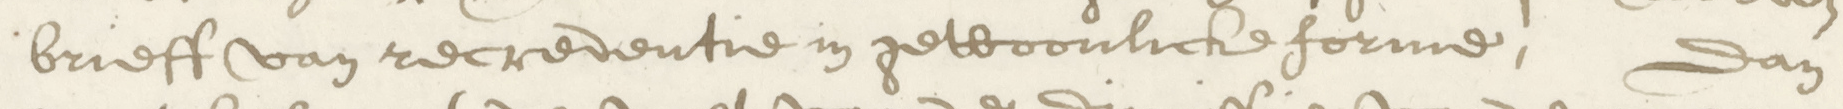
brieff van recredentie in gewoonlicke forme. Dan —
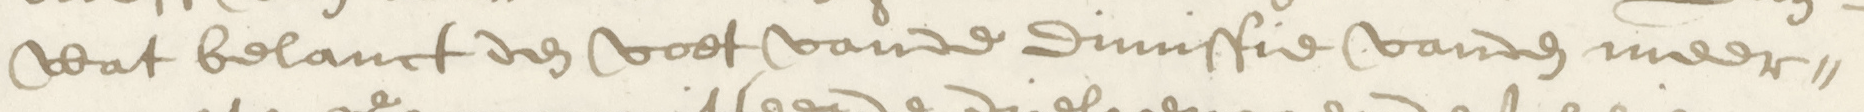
wat belanct den voet vande Dimissie vanden meer„
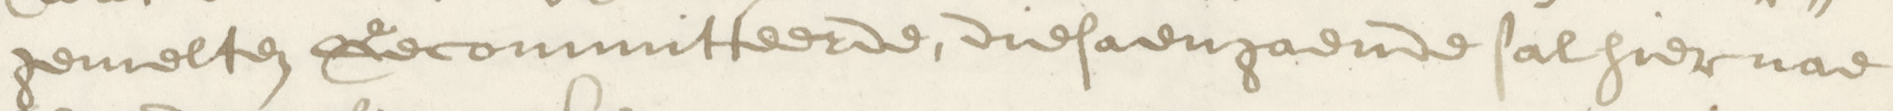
gemelten Gecommitteerde, diesaengaende sal hier nae
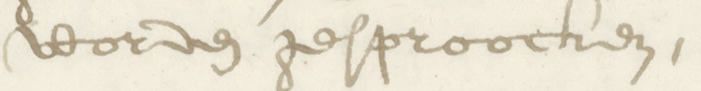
worden gesproocken.
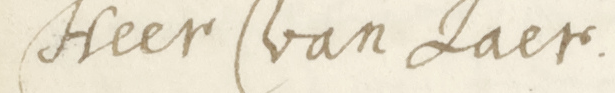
Heer van Laer.
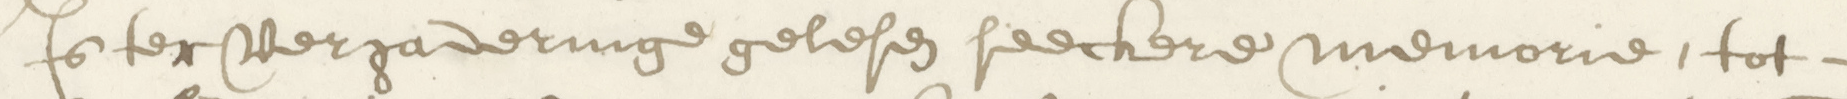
Is ter vergaderinge gelesen seeckere memorie, tot —
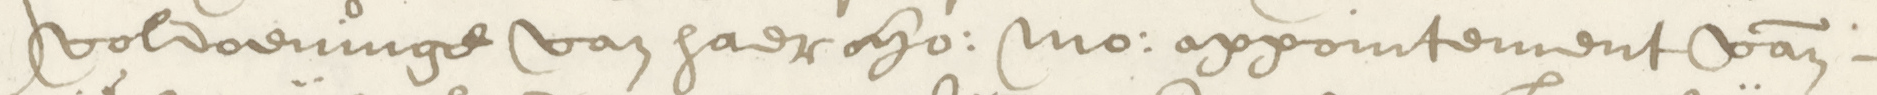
voldoeninge van haer Ho:Mo: appointement van
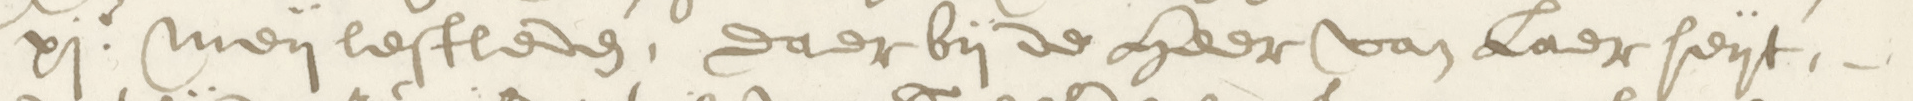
xie. meij lestleden, daer bij de heer van Laer seijt, —
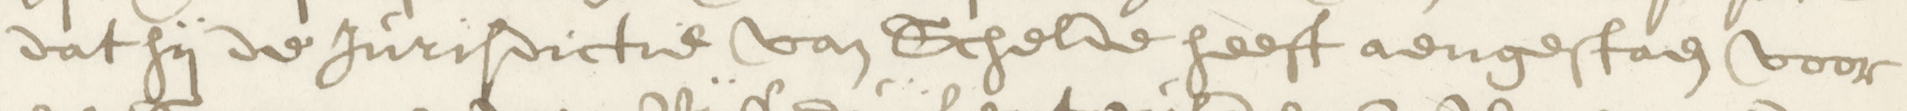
dat hij de Jurisdictie van Schelde heeft aengestaen voor
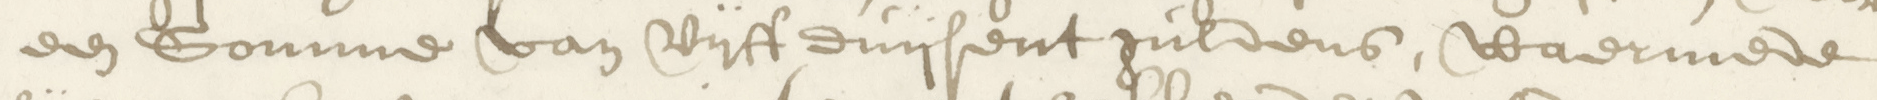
een Somme van vijff duijsent guldens, waermede
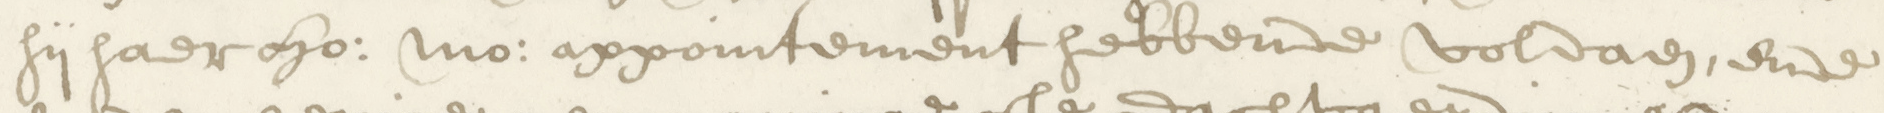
hij haer Ho:Mo: appointement hebbende voldaen, ende
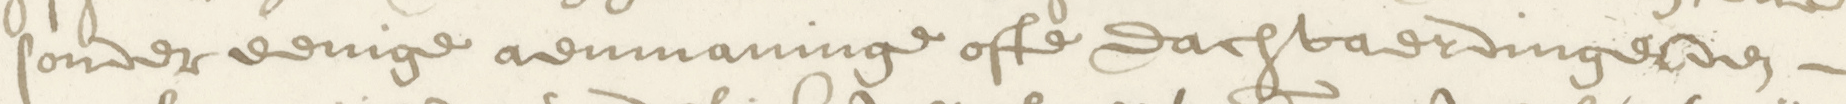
sonder eenige aenmaninge ofte Dachvaerdinge den —
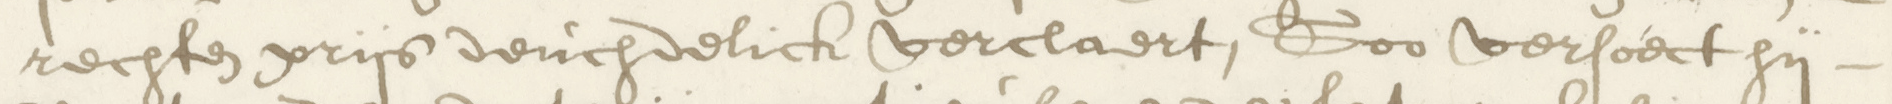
rechten prijs deuchdelick verclaert. Soo versoect hij -
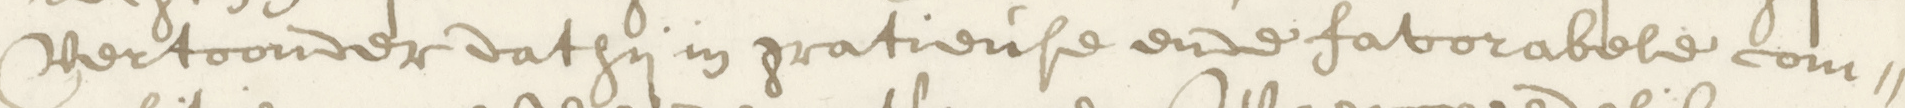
Vertoonder dat hij in gratieuse ende favorabele com„
